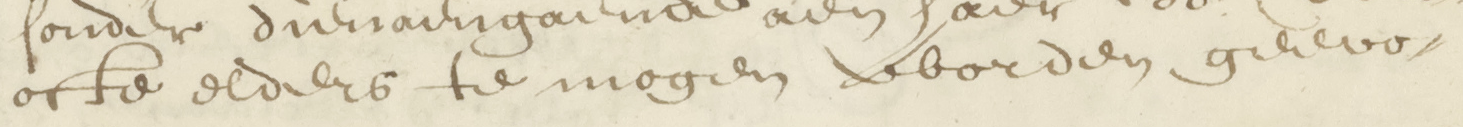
ofte elders te mogen worden geevo„
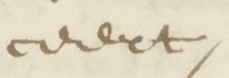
ceert.
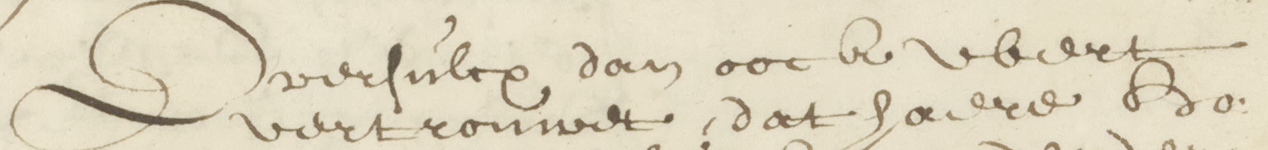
Oversulcx dan oock wert
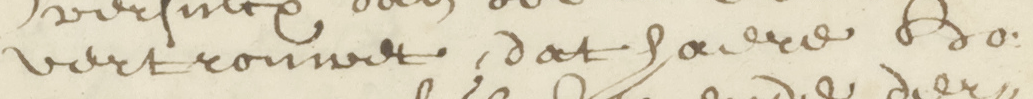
vertrouwet, dat haere Ho:
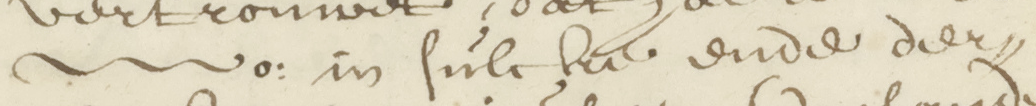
Mo: in sulcke ende der„
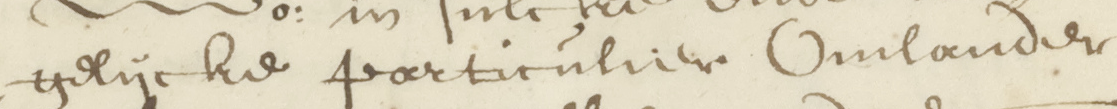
gelijcke particulier Omlander
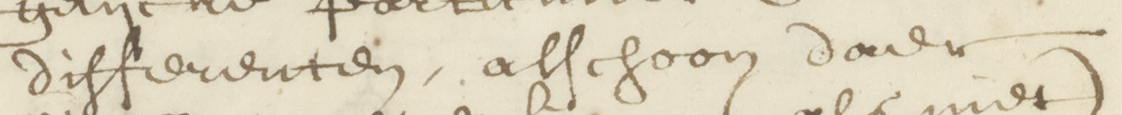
differenten, alschoon daer
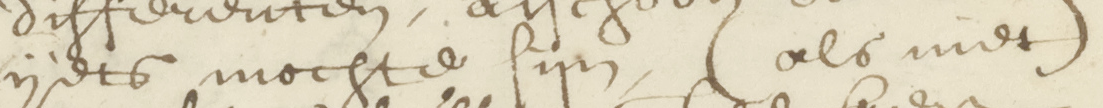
ijets mochte sijn, (als niet)
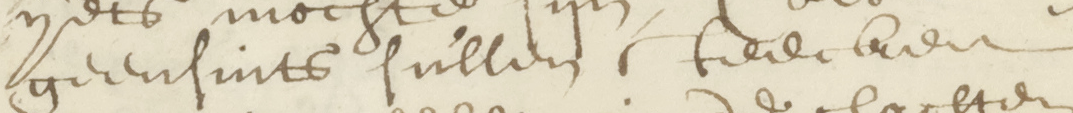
geensints sullen steecken
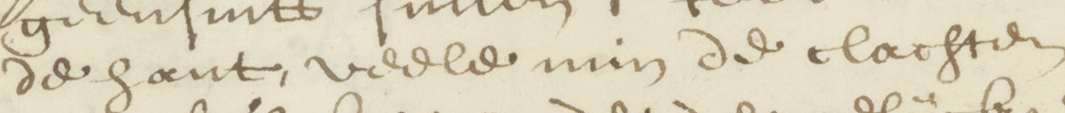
de hant, veele min de clachten
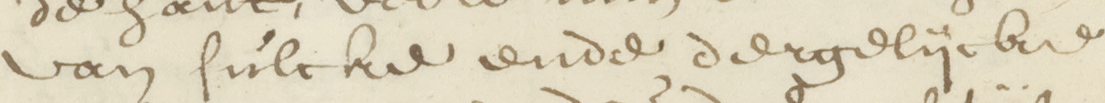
van sulcke ende dergelijcke
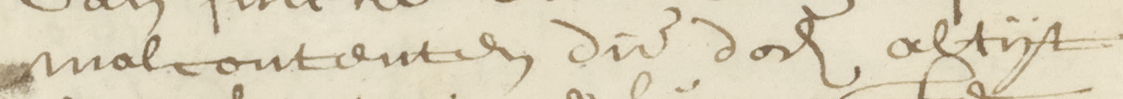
malcontenten die doch altijt
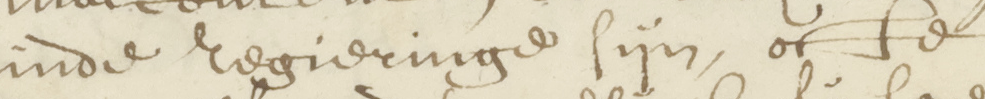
inde Regieringe sijn, ofte
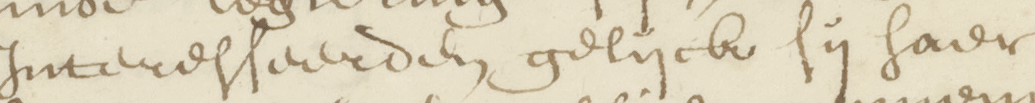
Interesseerden gelijck sij haer
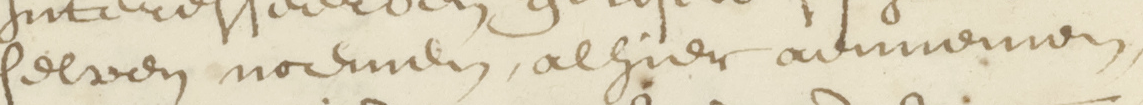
selven noemen, alhier aennemen,
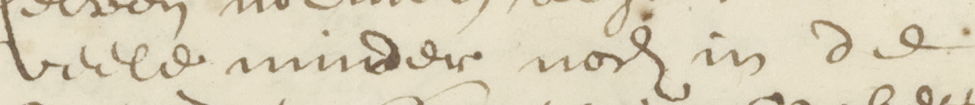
veele minder noch in de
